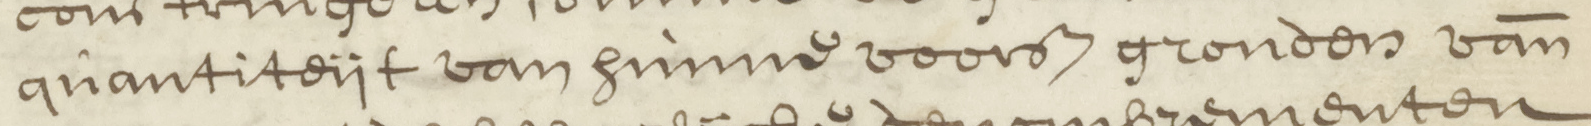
quantiteijt van hunne voorsz gronden van
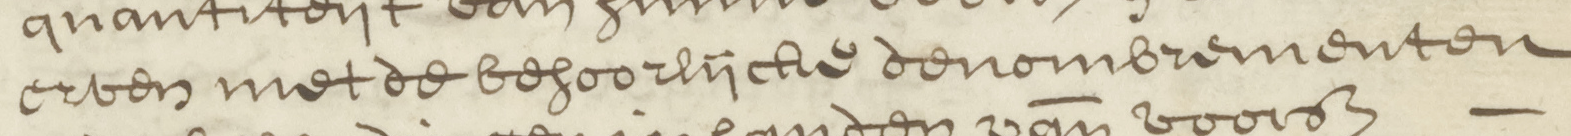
erven met de behoorlijcke denombrementen
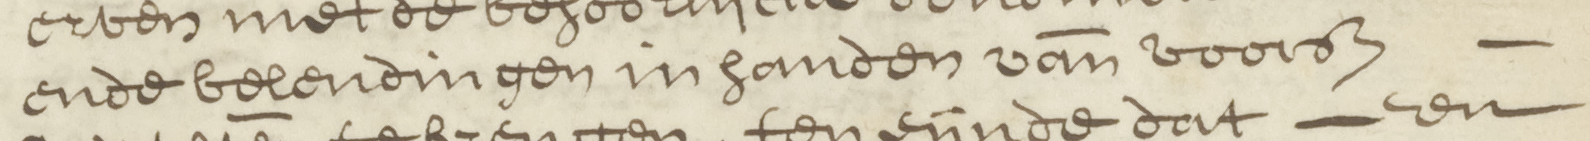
ende belendingen in handen van voorsz —
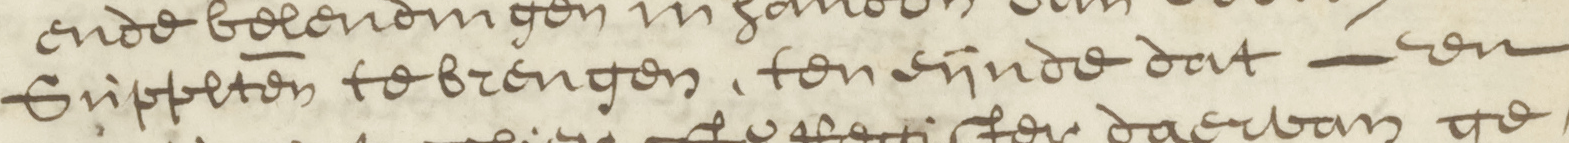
Supplten te brengen, ten eijnde dat een
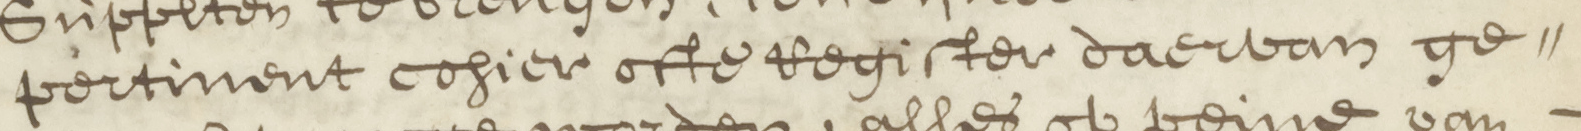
pertinent cohier ofte Register daervan ge,,
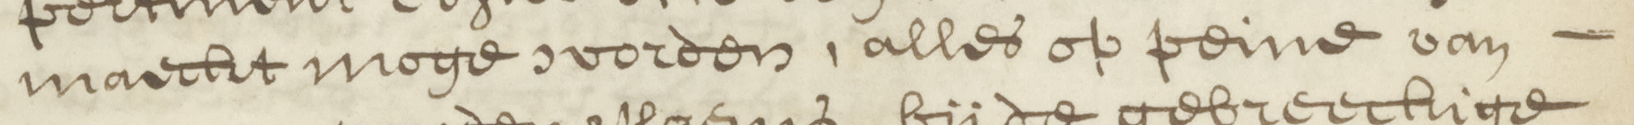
maeckt moge worden, alles op peine van —
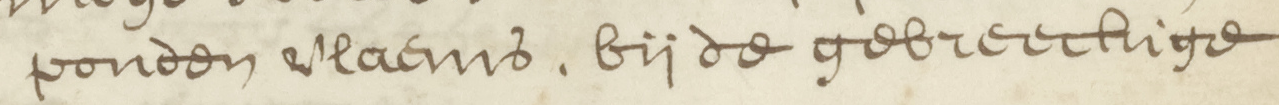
. . . ponden Vlaems, bij de gebreeckige
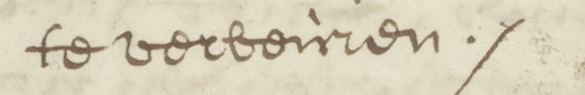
te verbeuren.
